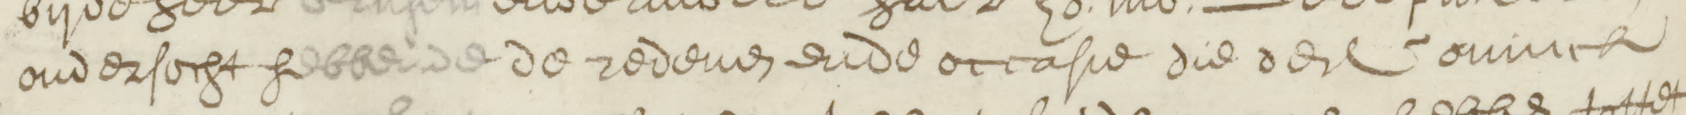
ondersocht hebbende de redenen ende occasie die den Coninck
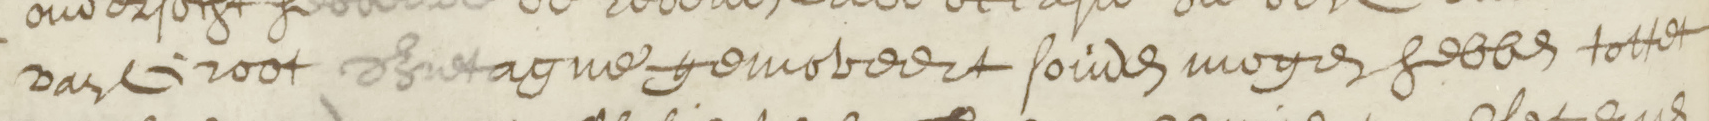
van Groot Bretagne gemoveert souden mogen hebben tottet
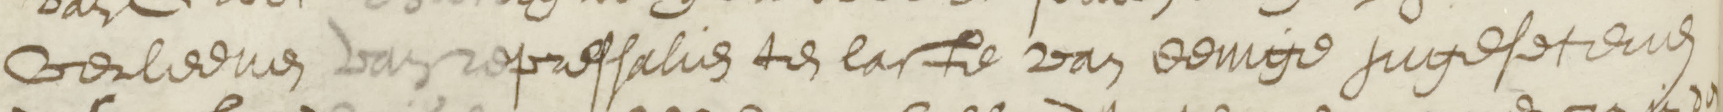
verleenen van repressalien ten laste van eenige ingesetenen
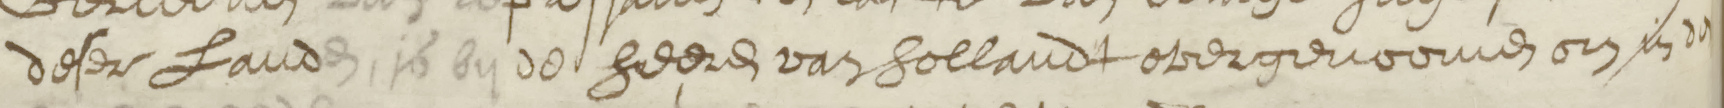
deser Landen, is by de heeren van hollandt overgenoomen om in de
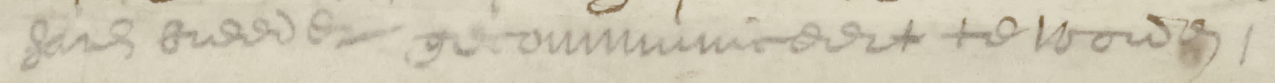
haren breeder gecommuniceert te worden.
